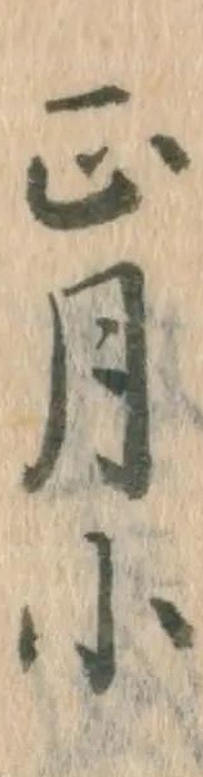正月小
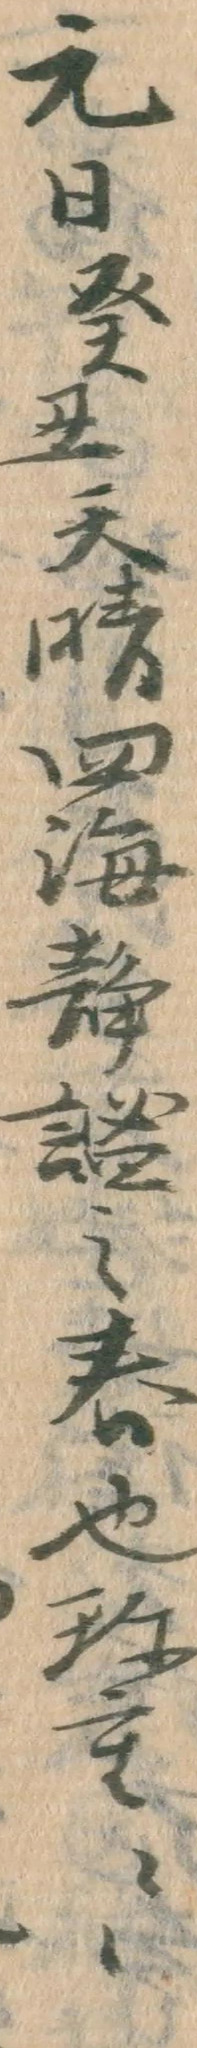元日癸丑天晴、四海静謐之春也、珍重〻〻、
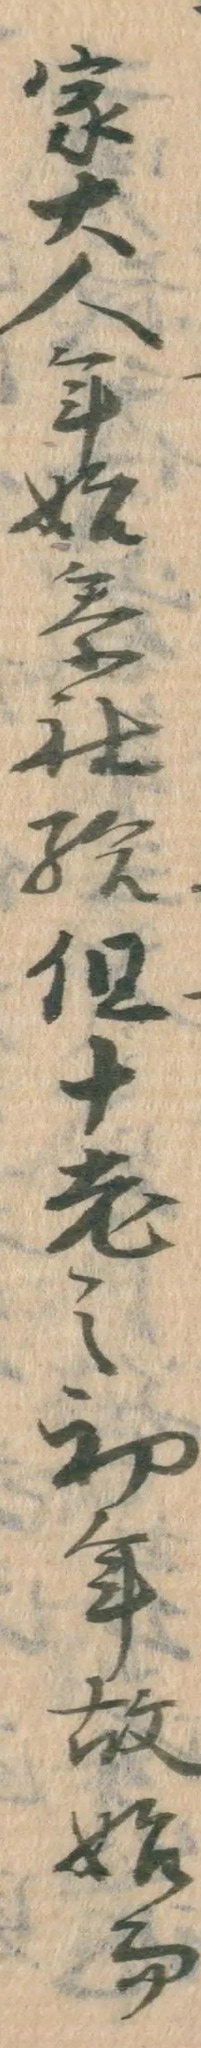家大人年始参社給、但十老之初年故、始而
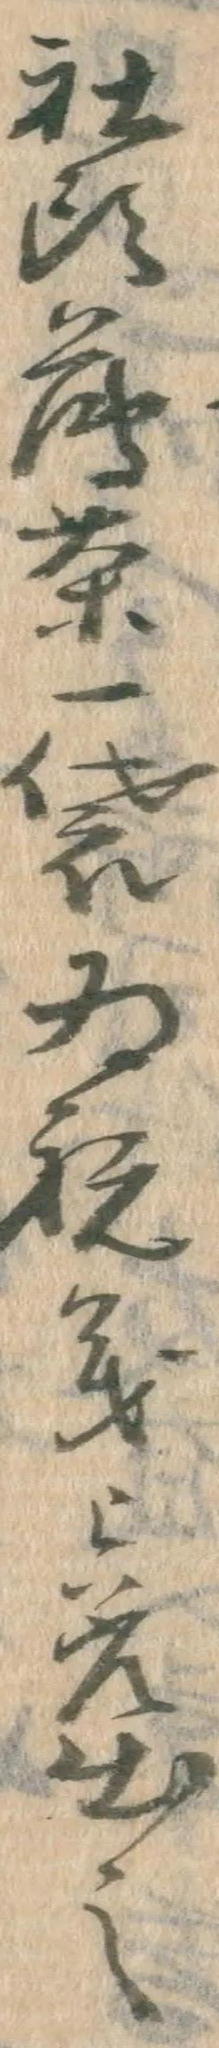社頭薄茶一袋為祝義被差出之、
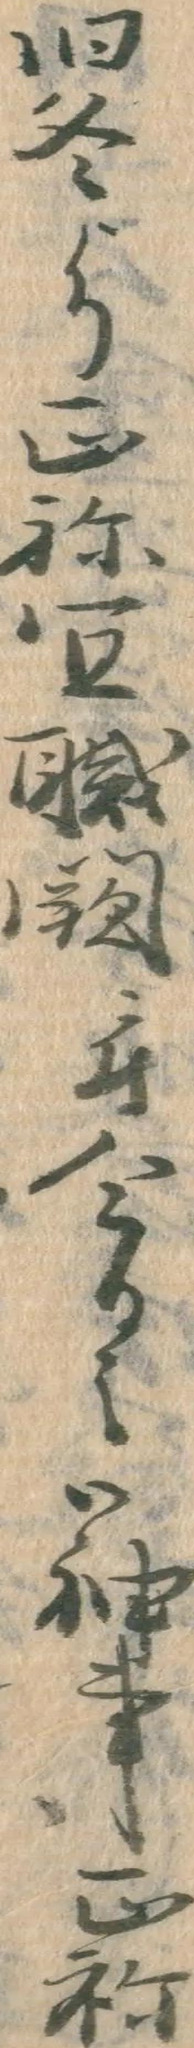旧冬より正称宜職闕ニ付、今日之御神事、正称
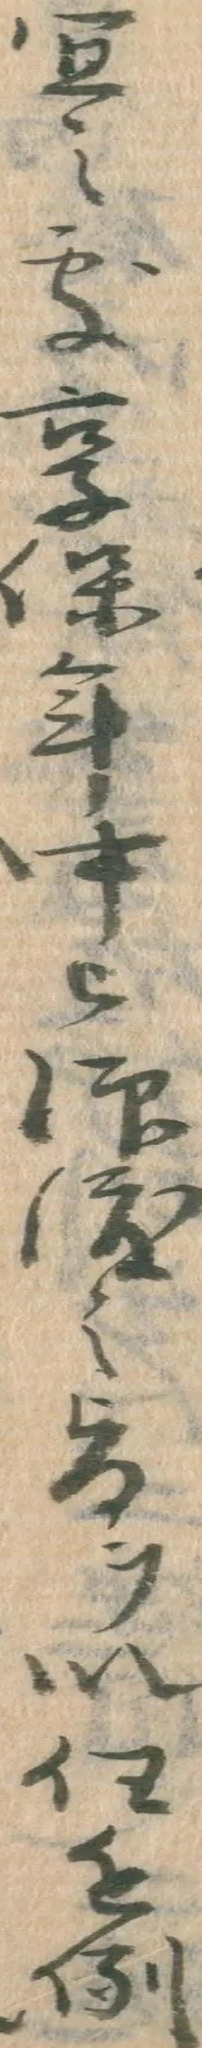宜之處、享保年中被仰渡之旨ヲ以、任近例
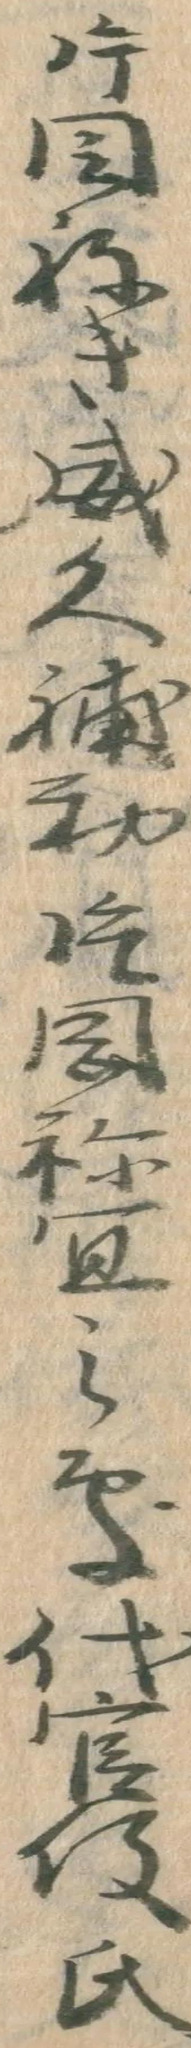片目ねき威久補勤、片岡弥宜之處、代官役氏
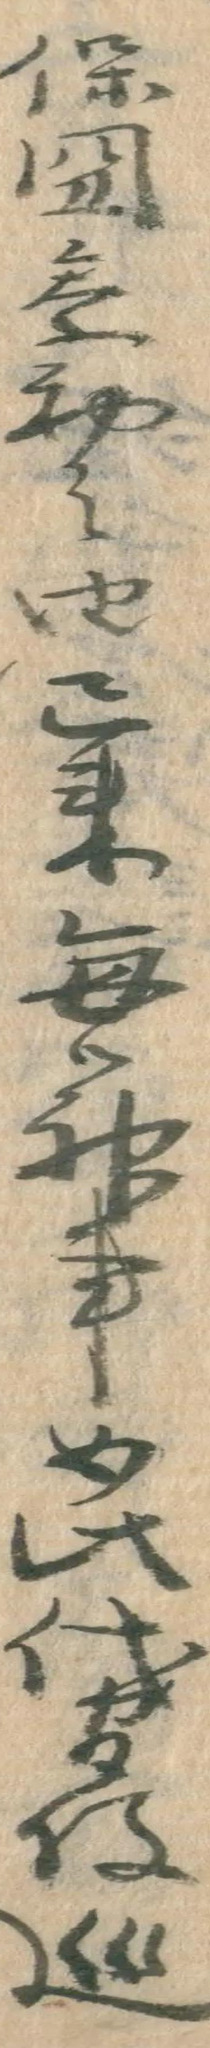保圀参勤之由、已来毎御神事如此代官役巡
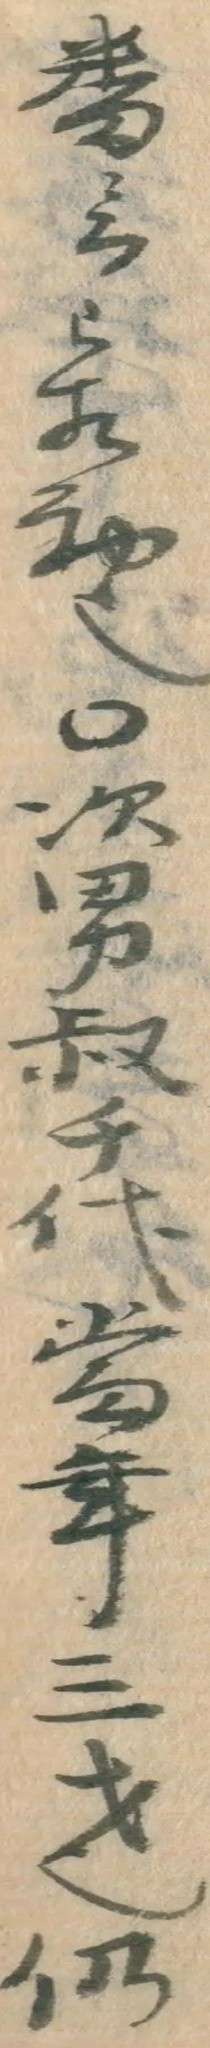番ニ而被相勤也、○次男叔千代當年三才也、仍

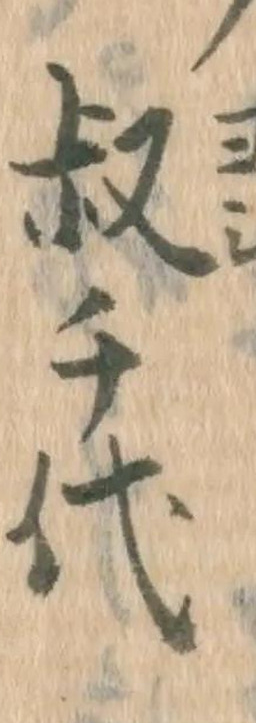叔千代
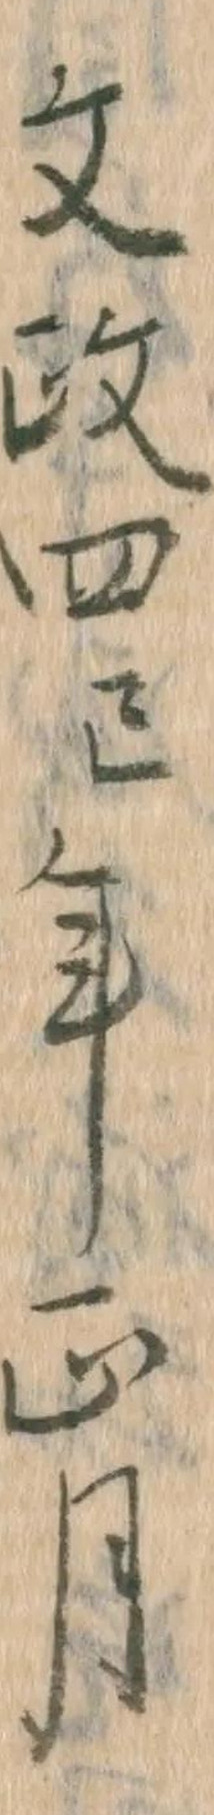文政四巳年正月
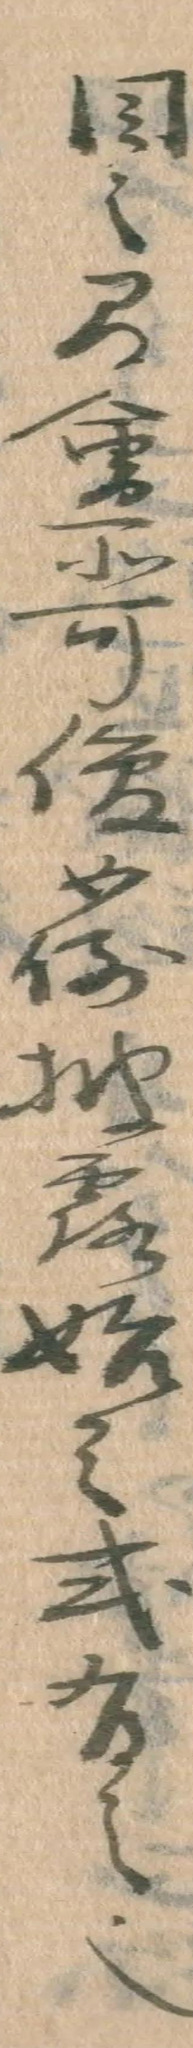目之間、會所可俊如例披露、始之式有之也、
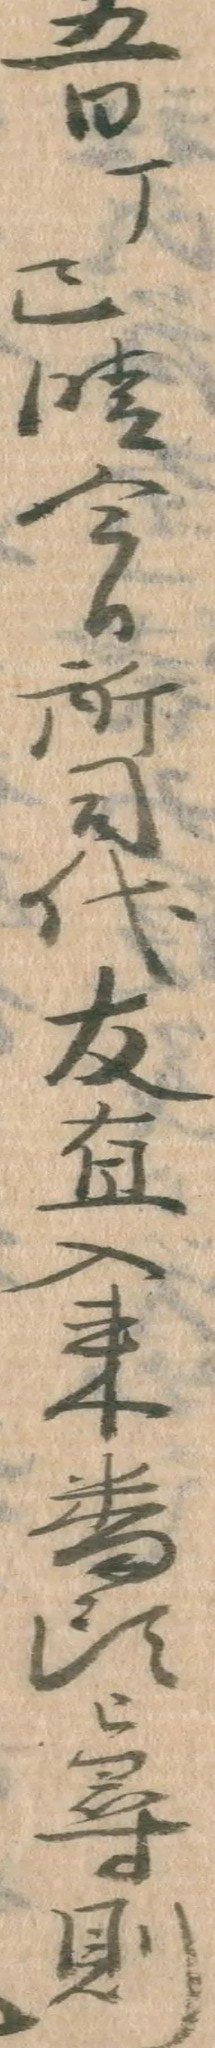五日丁巳晴、今日所司代友直入来、番頭被尋、則
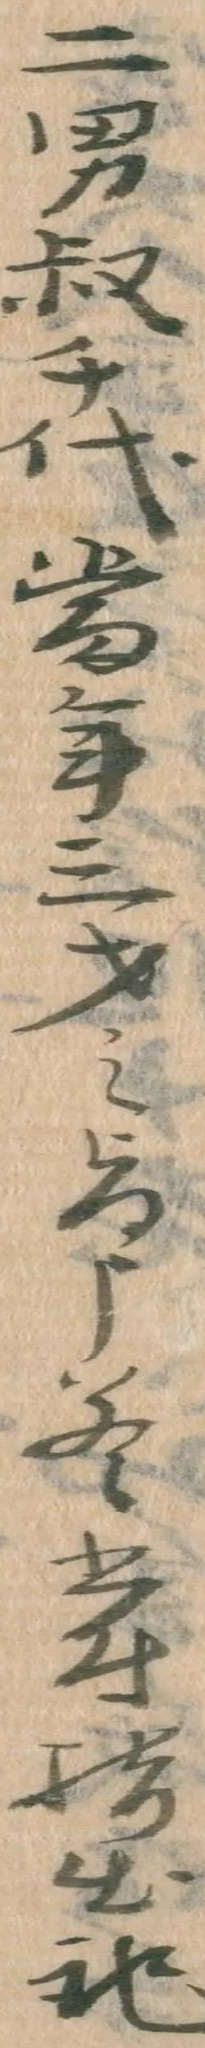二男叔千代、當年三才之旨申答書付指出、記
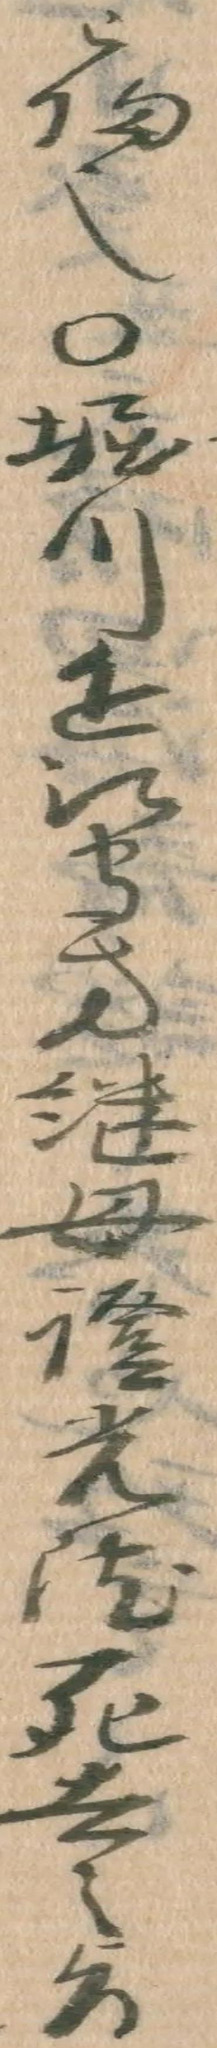被帰之、○堀川近江守方継母証光院死去之旨
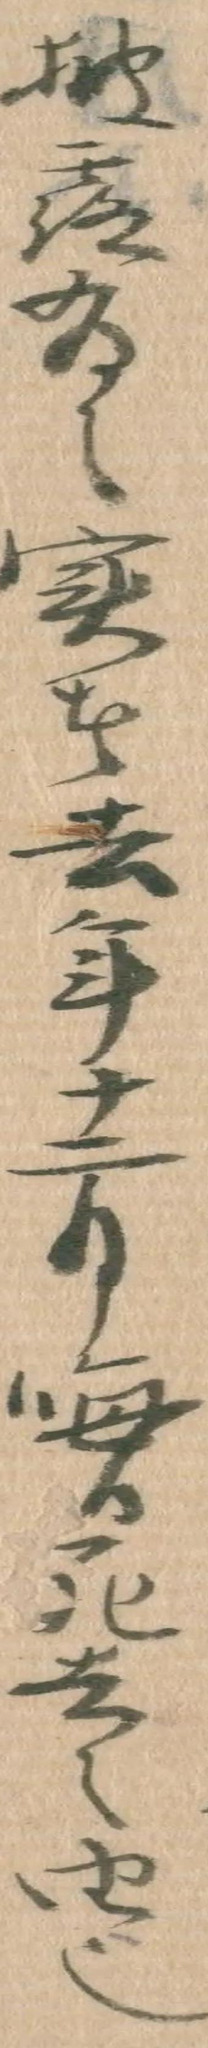披露有之、実者、去年十二月晦日死去之由也
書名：賀茂社記録. 第63冊
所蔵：国立国会図書館 National Diet Library, JAPAN
